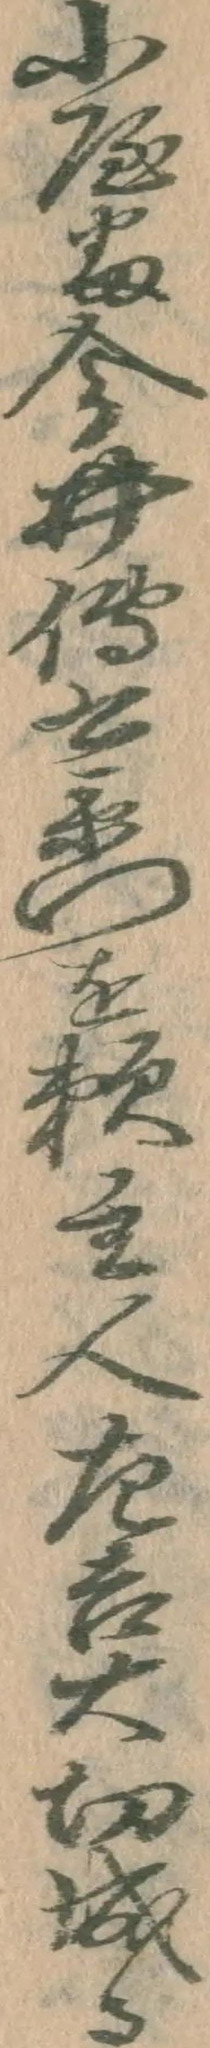小屋番今井伝右衛門を頼主人左吉大切成る
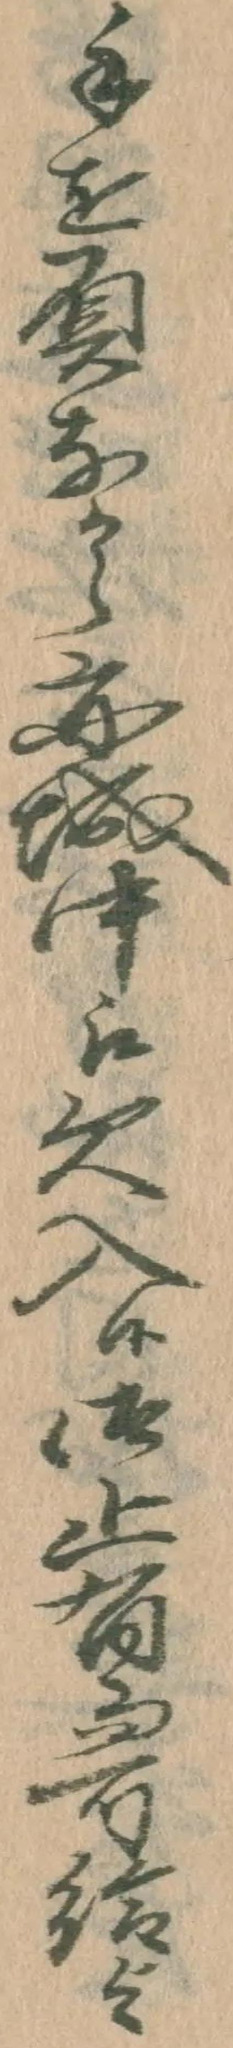手を負なから亦城中江欠入候御止有而可給与
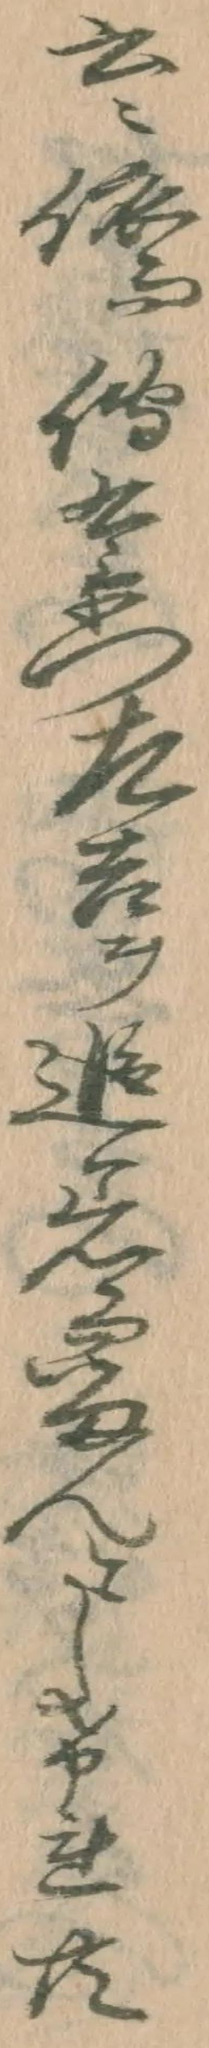云に依而伝右衛門左吉を追着而留んとし希連共
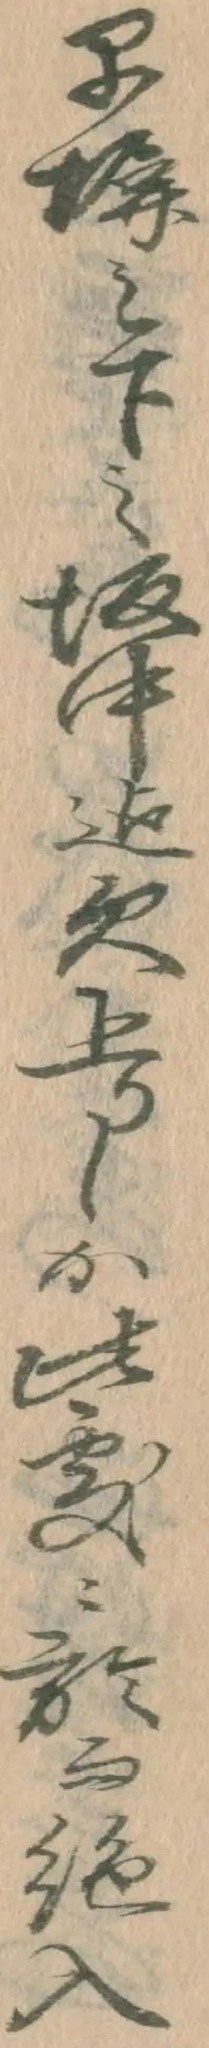早塀と下之坂中迄欠上りしか此處に放而絶入
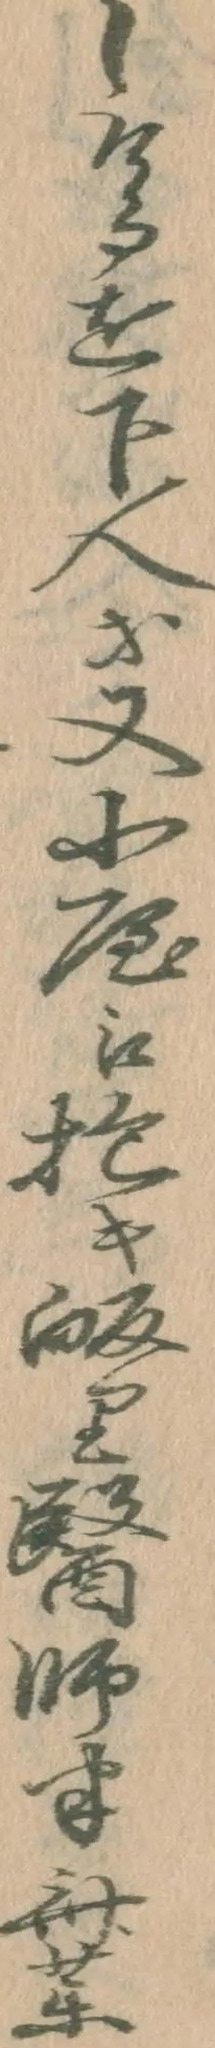しけるを下人等又小屋江抱き皈里醫師半斎薬
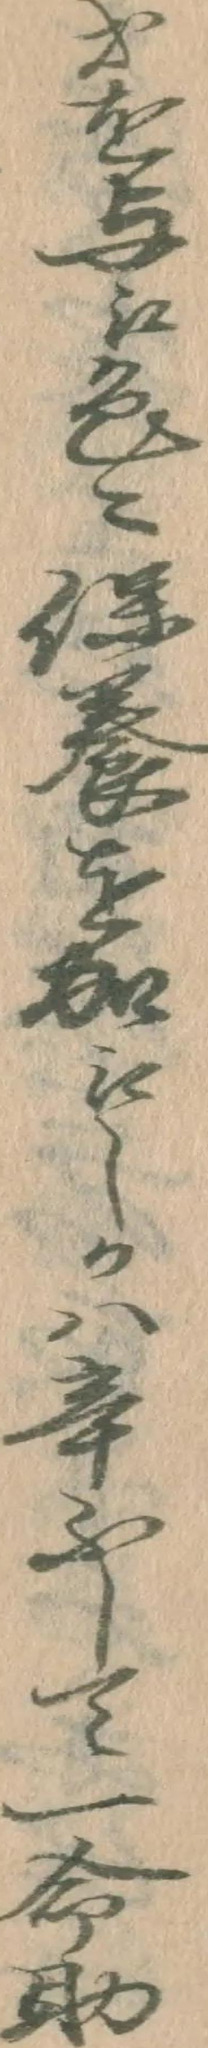等を与江色々保養を加江しかは辛ふして一命助
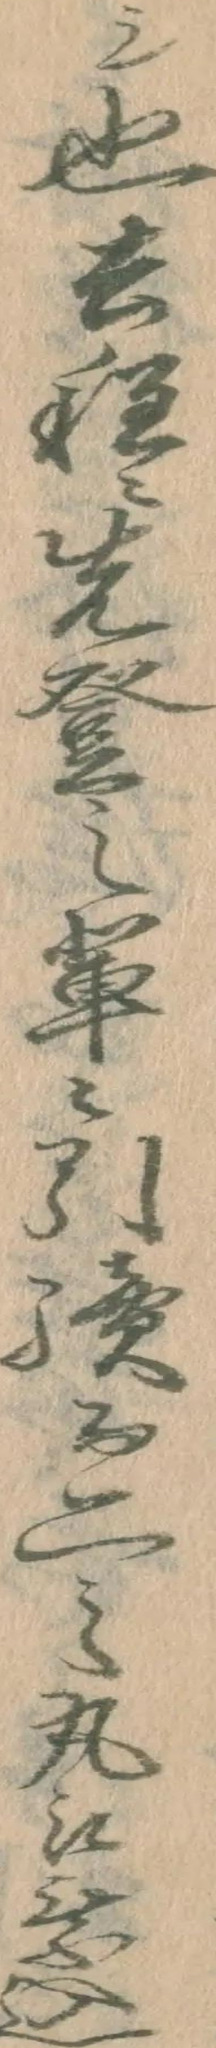し也去程に先登之輩に引続而二之丸江乗込
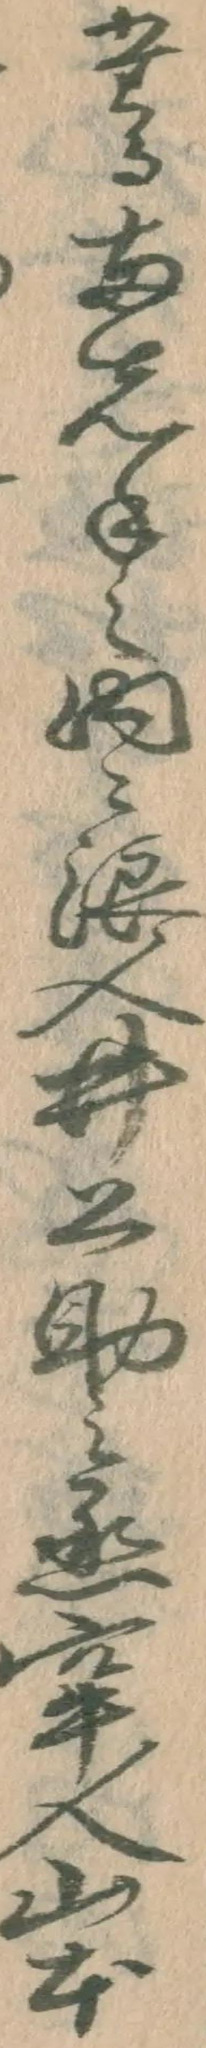堂る両先手之内に浪人井上助之丞牢人山本
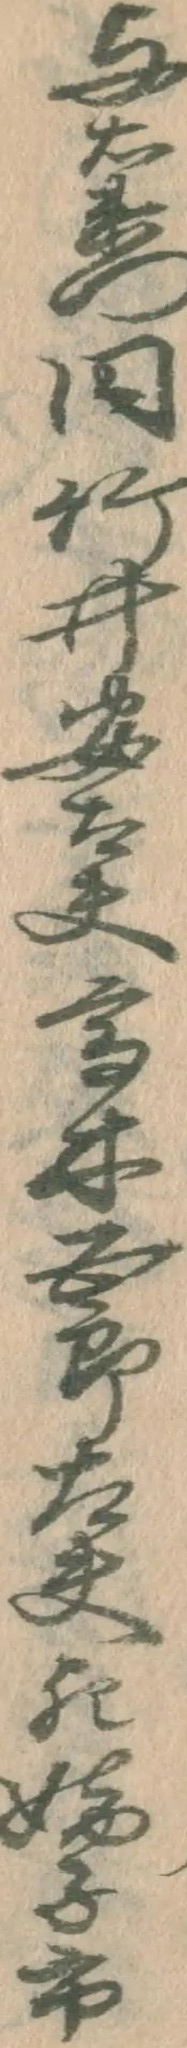与右衛門同竹井安太夫高木五郎太夫歟嫡子市
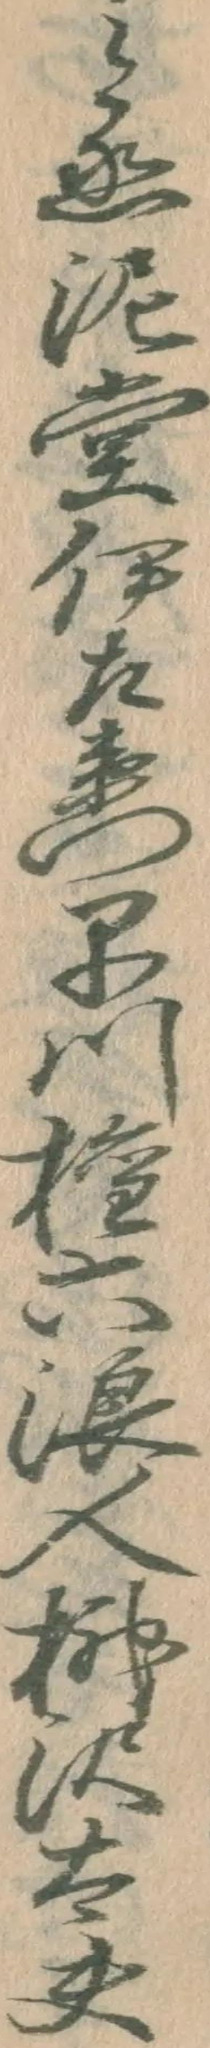之丞泥堂伊左衛門早川権六浪人柳沢太夫
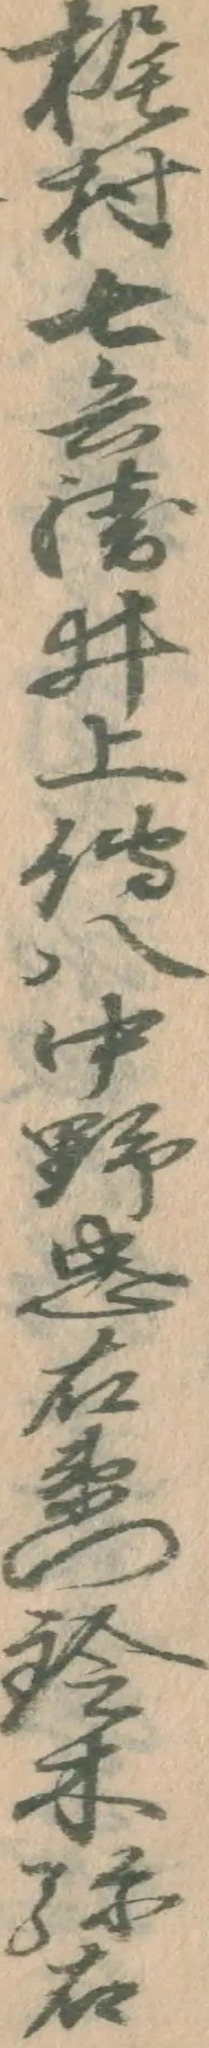梶村七兵衛井上伝八中野忠右衛門鈴木弥右
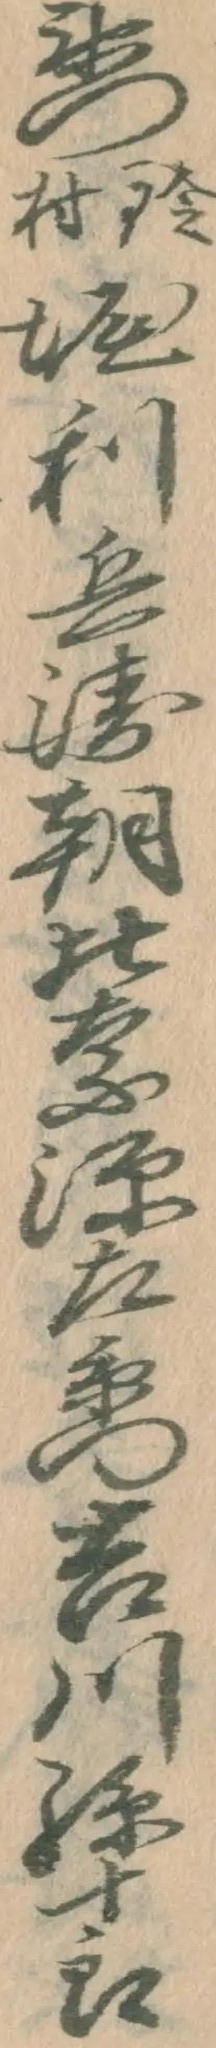衛門鈴村堀利兵衛朝比奈源左衛門吉川弥十郎

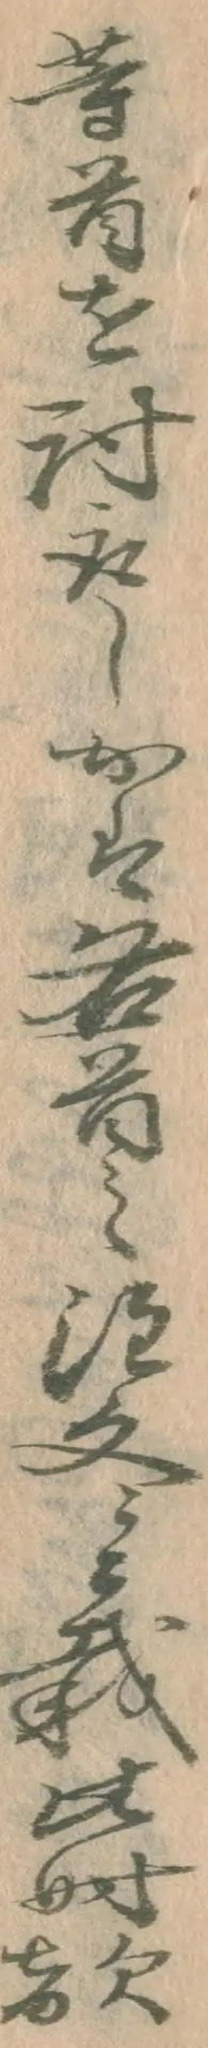等首を討取しか盤各首之注文に被載此時敵
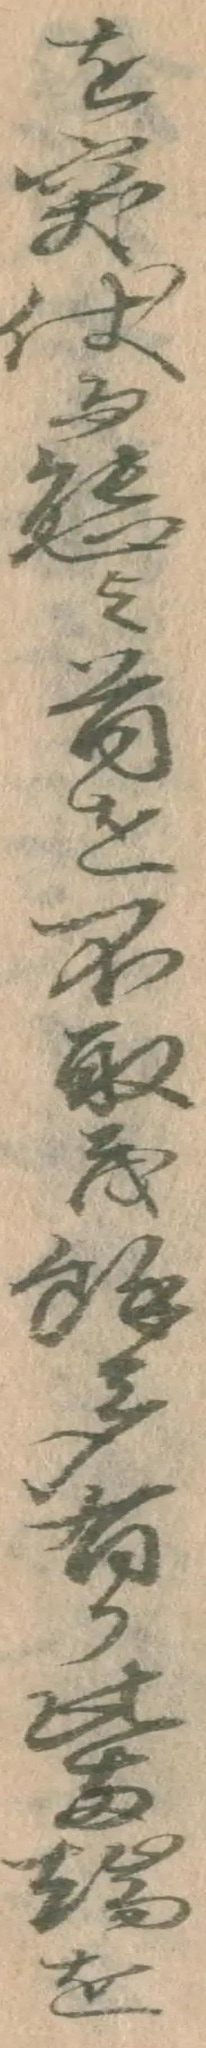を突伏而熊与首を不取茂余多有り此両端を
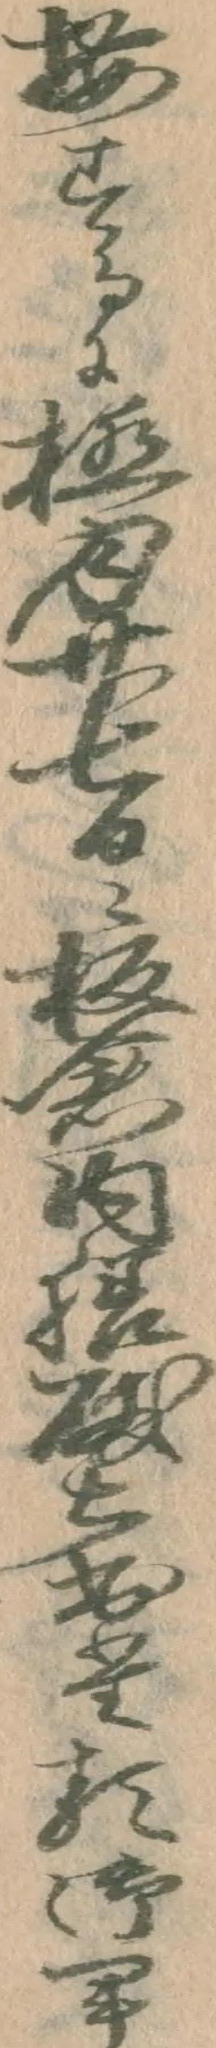按春る尓極月廿七日に板倉内膳殿被出堂類御軍
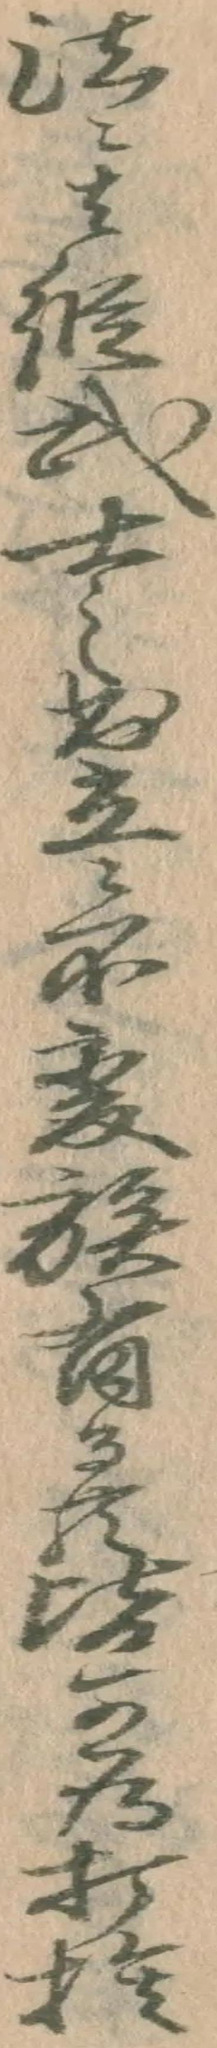法に者縦武士之出立に不変族有る共皆可違為打捨
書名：切支丹御退治記 49巻. [8]
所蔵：国立国会図書館 National Diet Library, JAPAN
